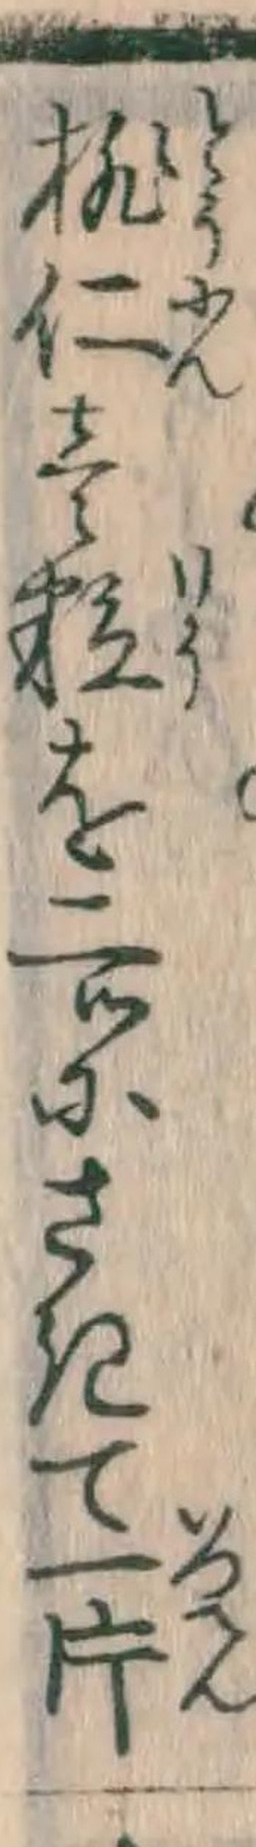桃仁壱粒を二ッにさきて一片
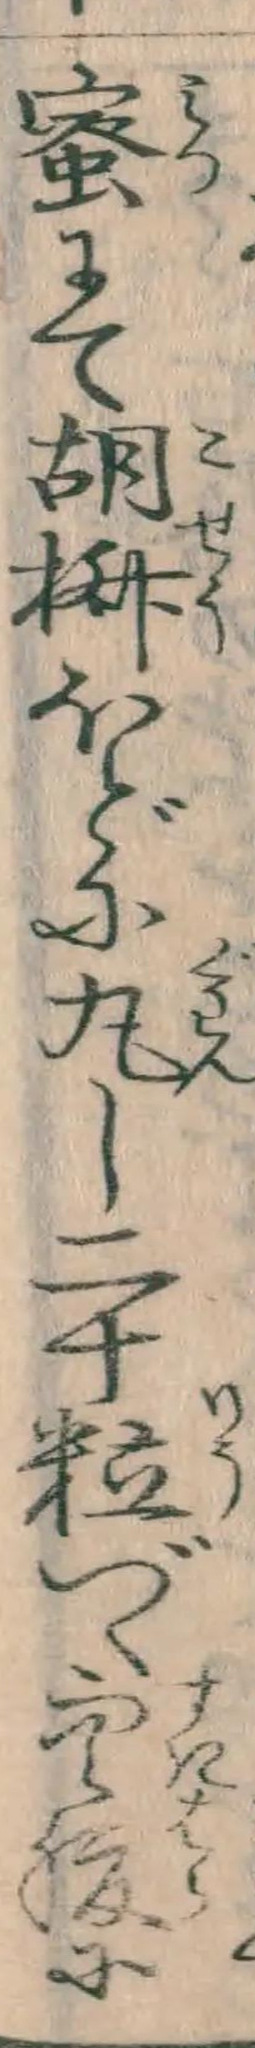蜜にて胡桝ほどに丸し二十粒づゝ空腹に
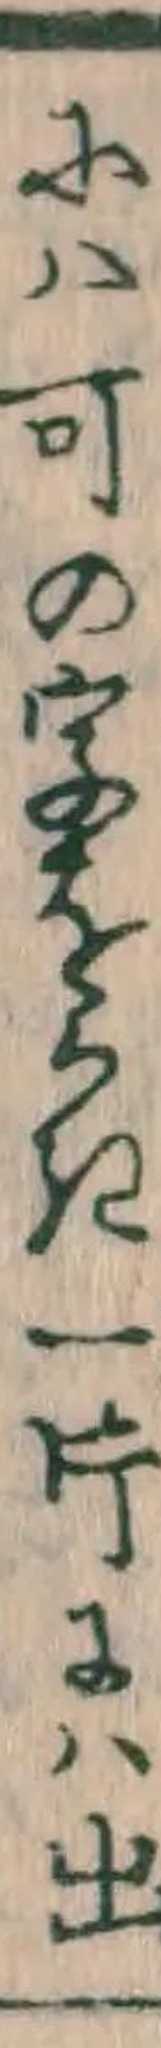には可の字をかき一片には出
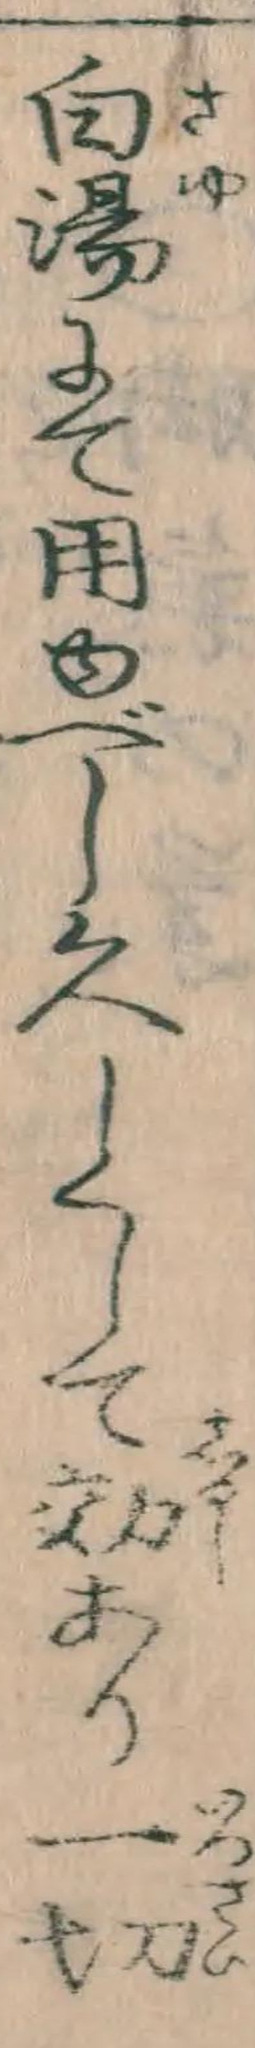白湯にて用ゆべし久しくして効あり一切
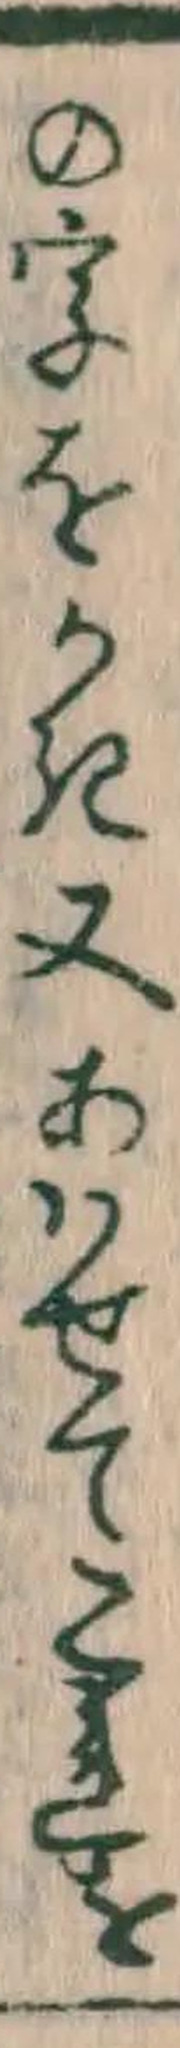の字をかき又あはせてこれを
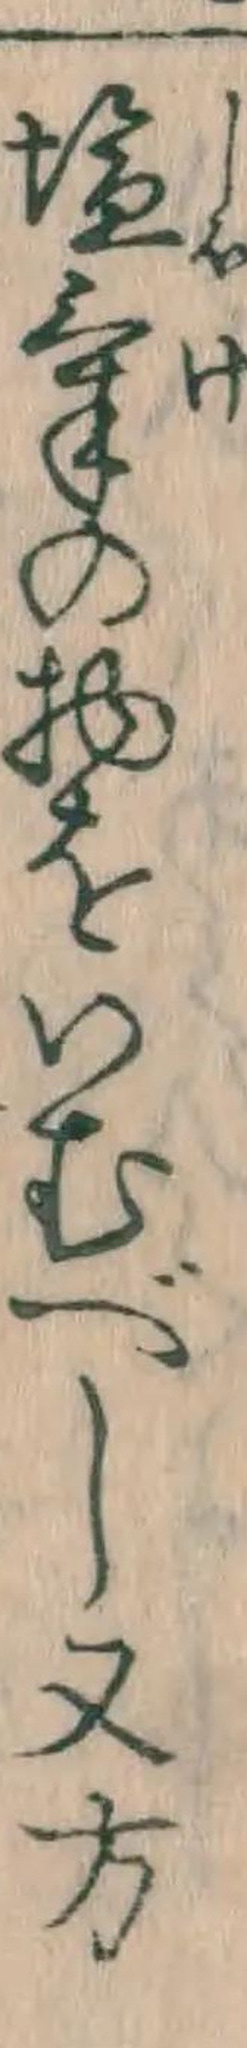塩気の物をいむべし又方
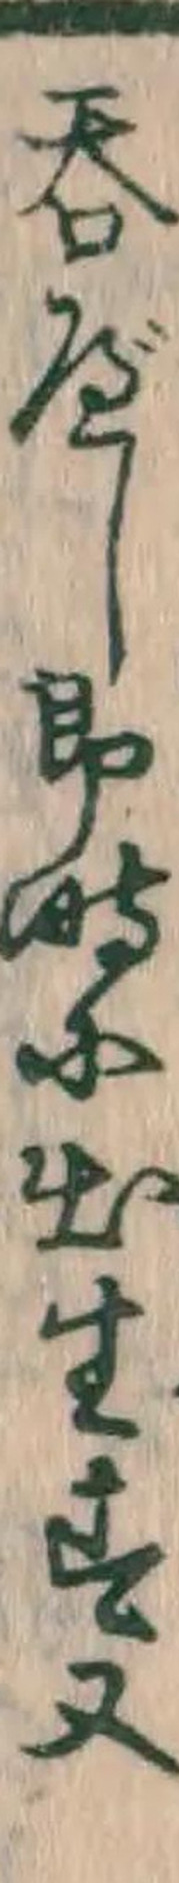吞べし即時に出生す又
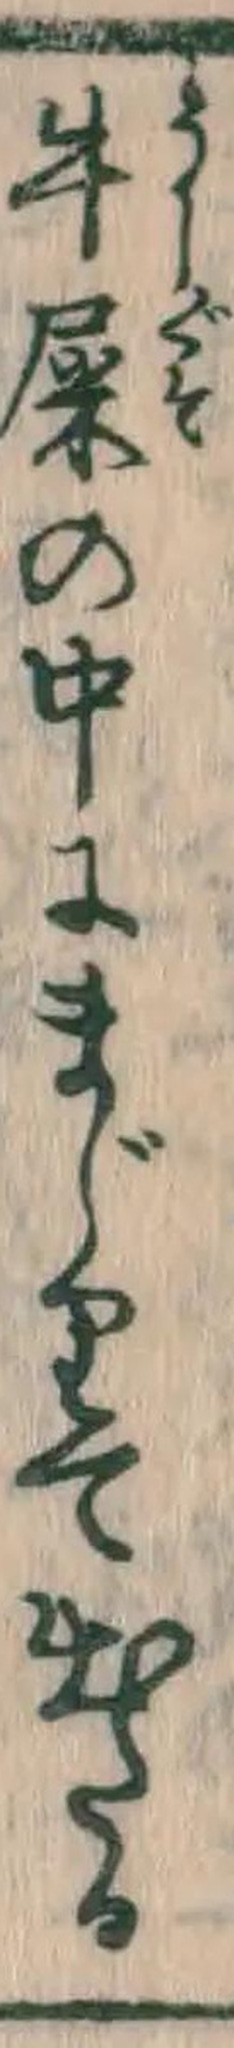牛屎の中にまりじて出たる
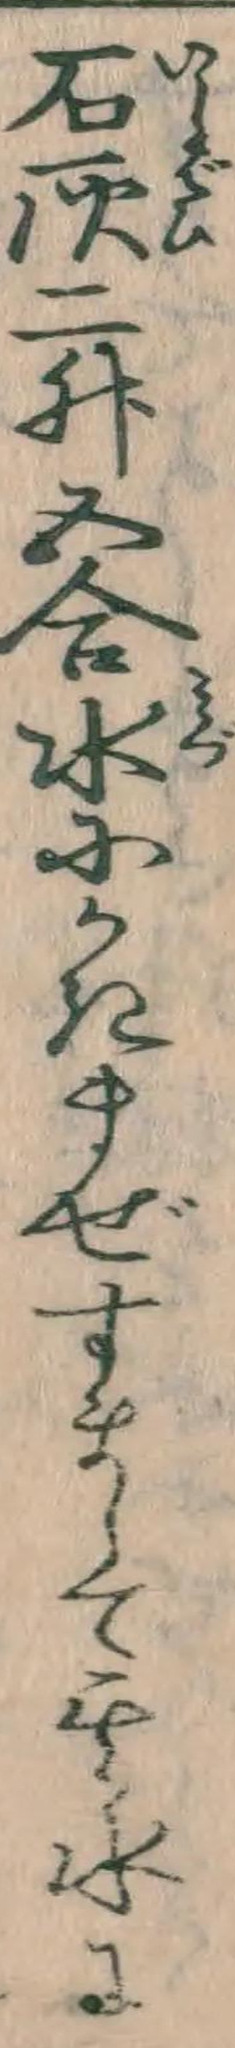石灰二升五合水にかきまぜすまして其水に
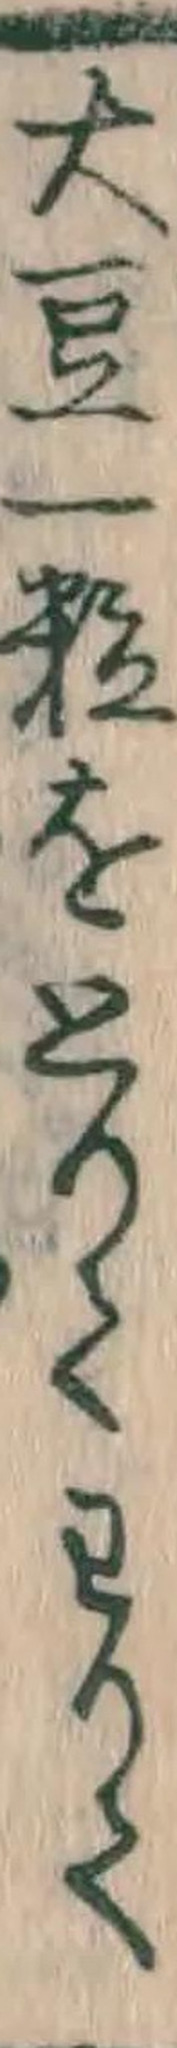大豆一粒をとりてわりて
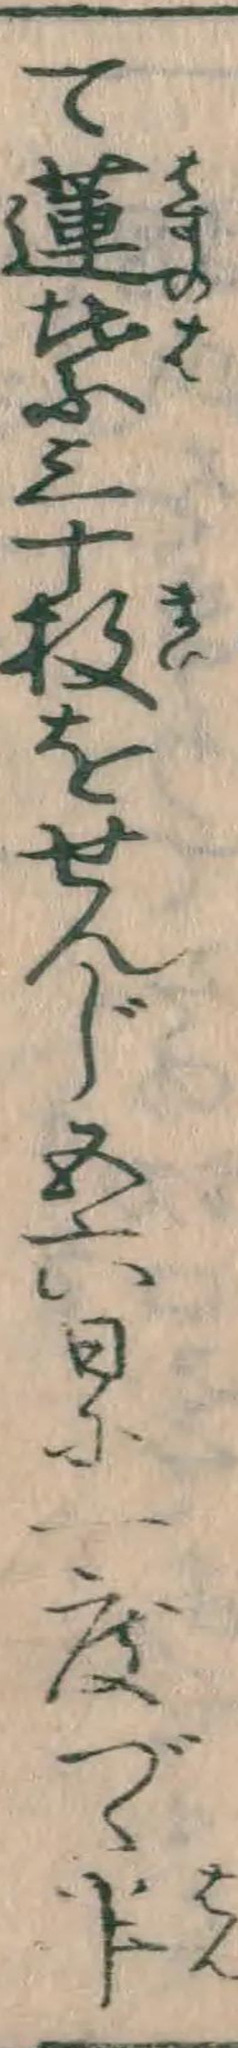て蓮葉三十枚をせんじ五六日に一度づゝ半
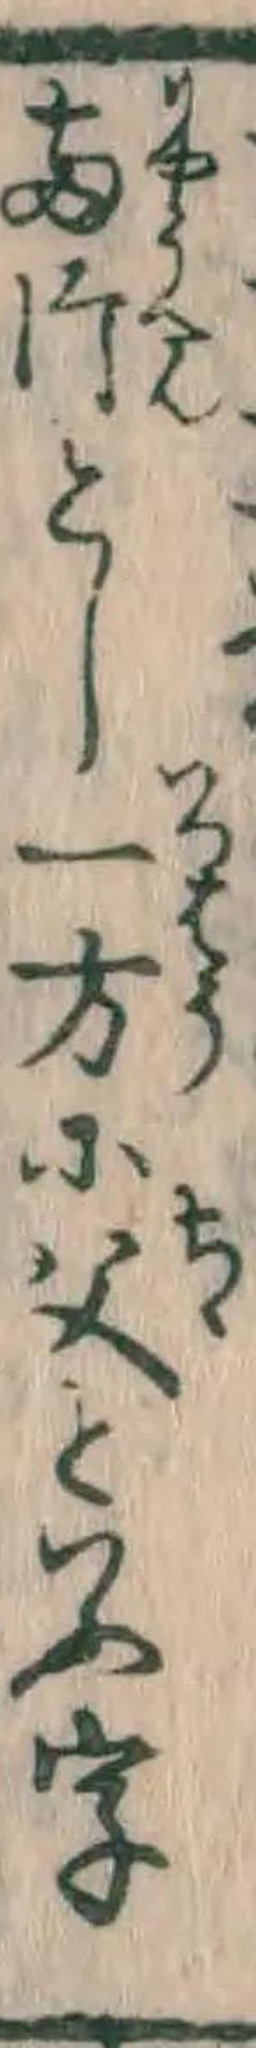両片とし一方に父といふ字
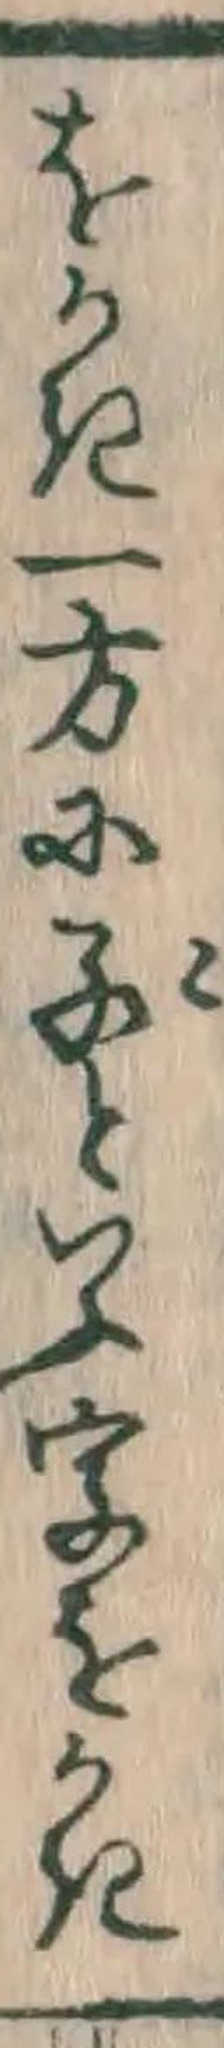をかき一方に子といふ字をかき
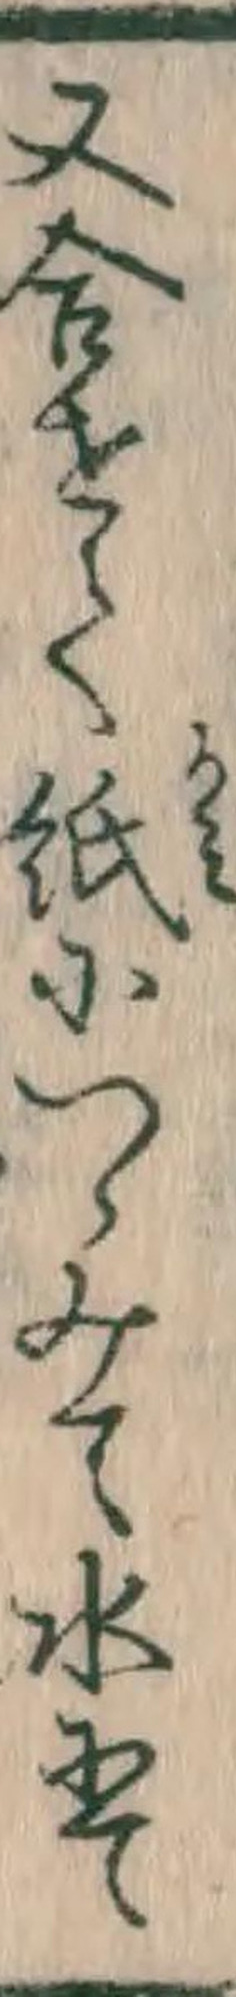又合せて紙につゝみて水にて
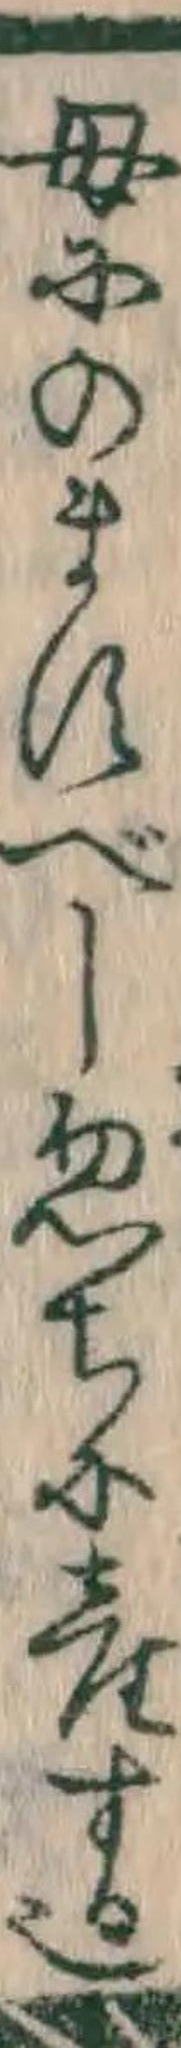母にのますべし忽ちに産する也
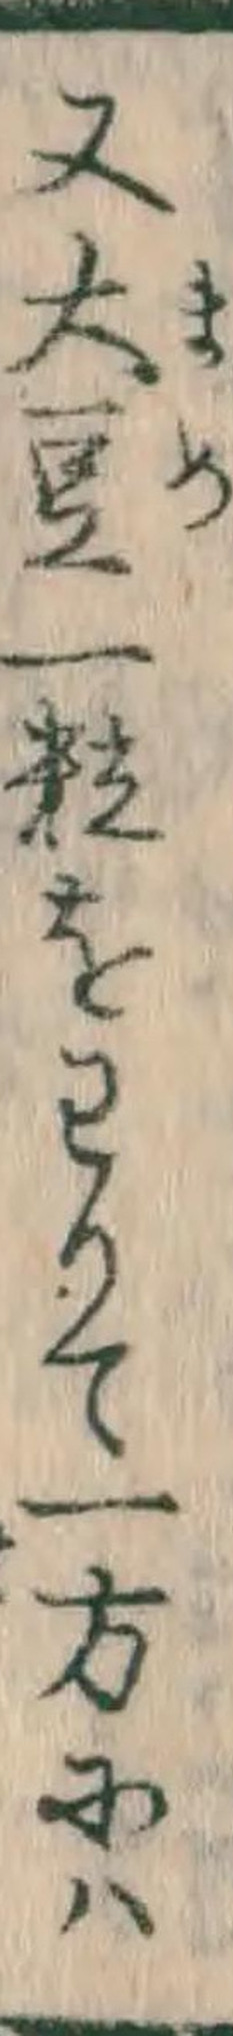又大豆一粒をわりて一方には
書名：広益秘事大全 3巻. [4]
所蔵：国立国会図書館 National Diet Library, JAPAN
